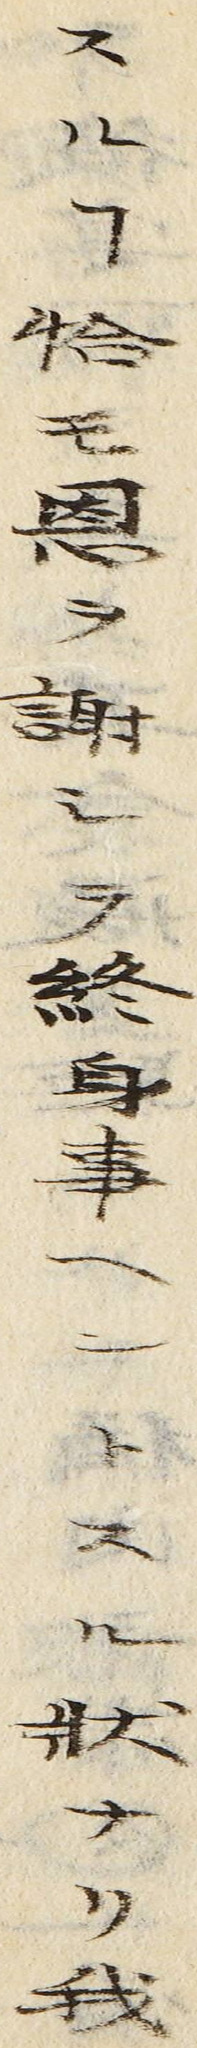スルコト恰モ恩ヲ謝シテ終身事ヘントスル状ナリ我
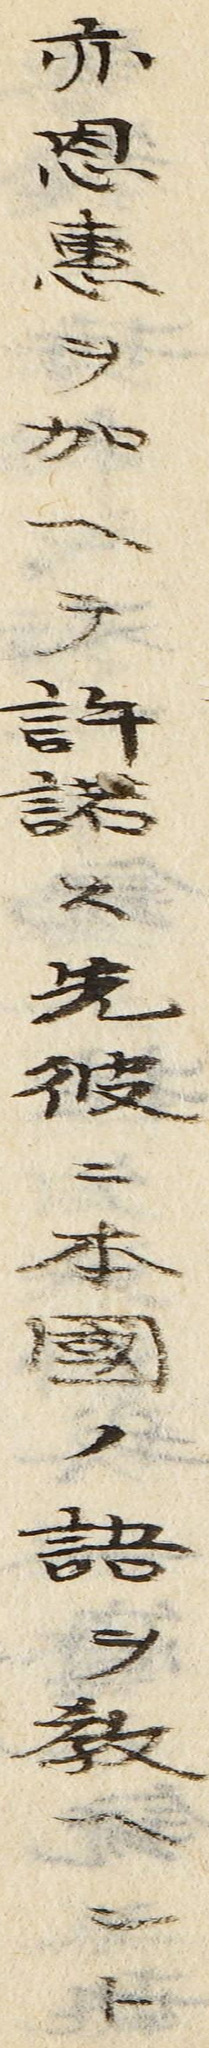亦恩恵ヲ加ヘテ許諾ス先彼ニ本国ノ語ヲ教ヘント
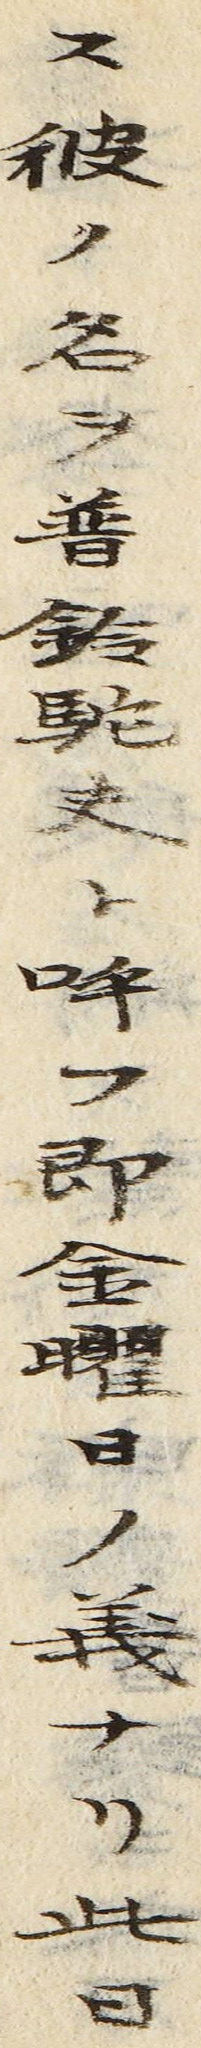ス彼ノ名ヲ普鈴駝夫ト呼フ即金曜日ノ義ナリ此日
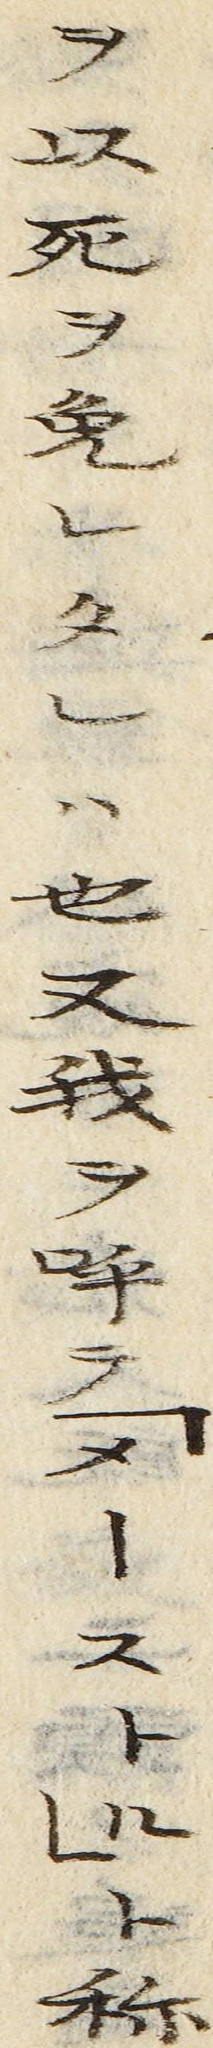ヲ以死ヲ免レタレハ也又我ヲ呼テ「メーストル」ト称
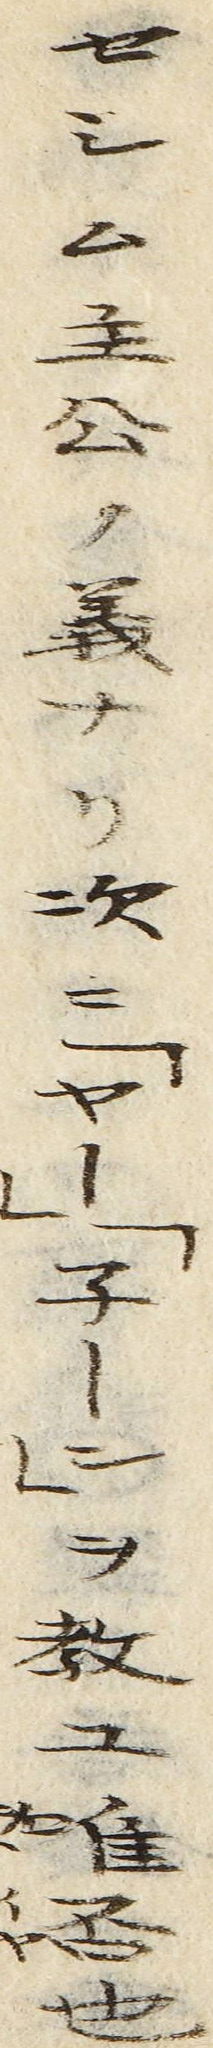セシム主公ノ義ナリ次ニ「ヤー」「ネーン」ヲ教ユ唯否也

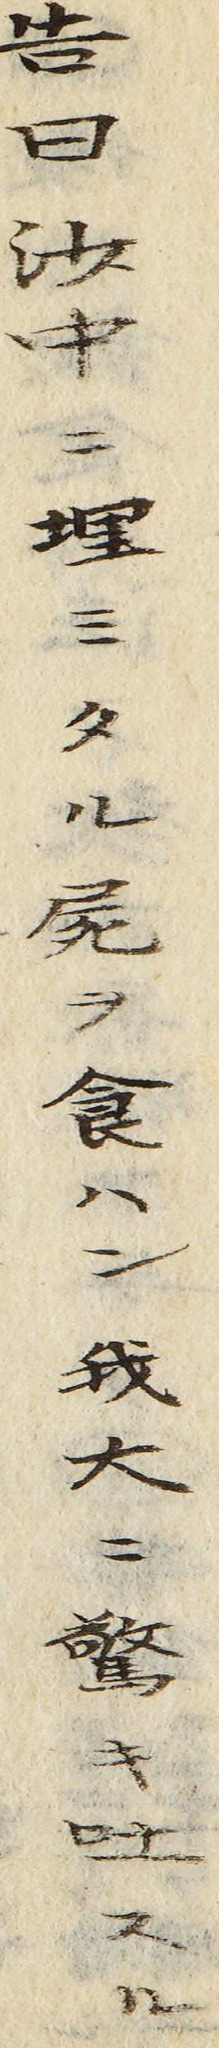告曰沙中ニ埋ミタル屍ヲ食ハン我大ニ驚キ吐スル
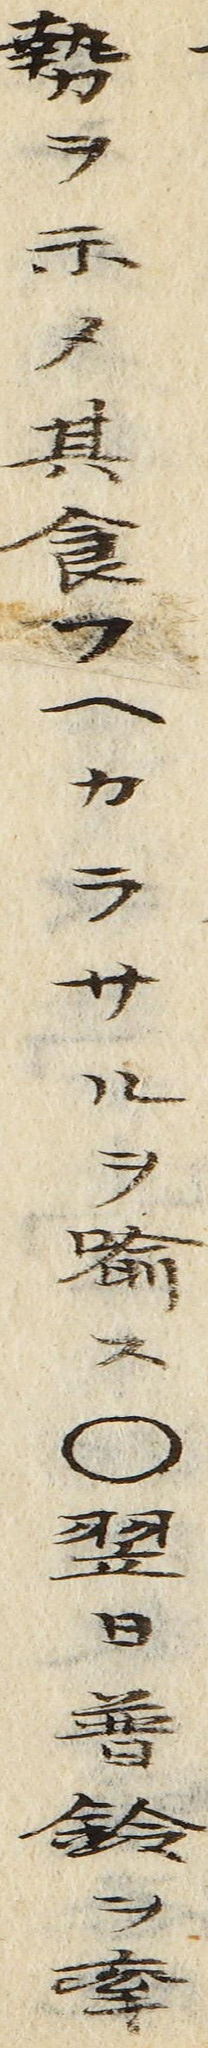勢ヲ示シテ其食フヘカラサルヲ喩ス◯翌日普鈴ヲ率
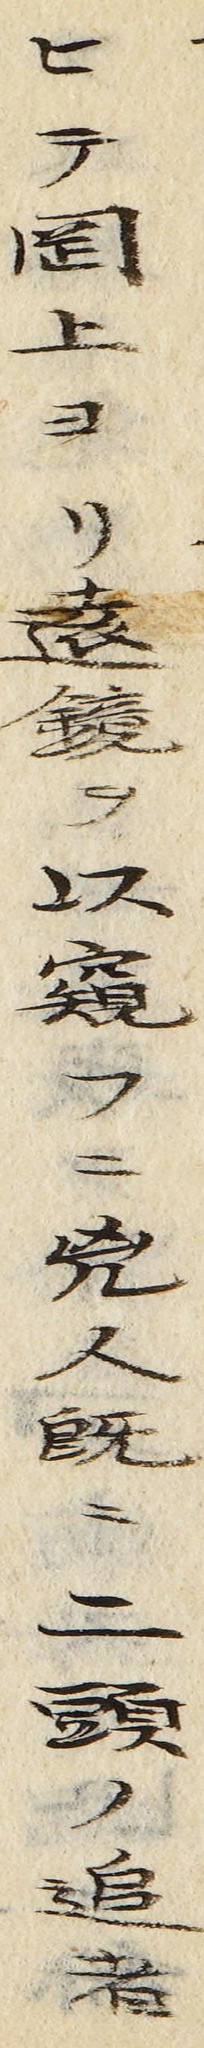ヒテ岡上ヨリ遠鏡ヲ以窺フニ兇人既ニ二頭ノ追者
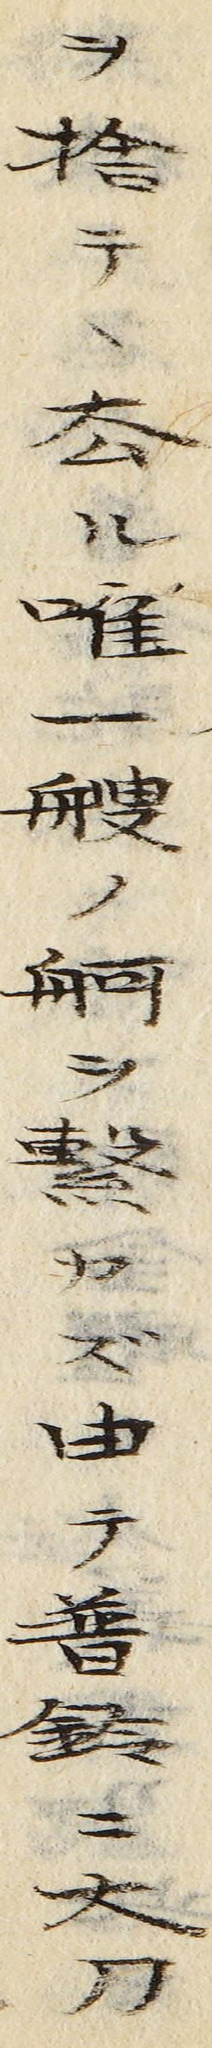ヲ捨テヽ去ル唯一艘ノ舸ヲ繋カズ由テ普鈴ニ大刀
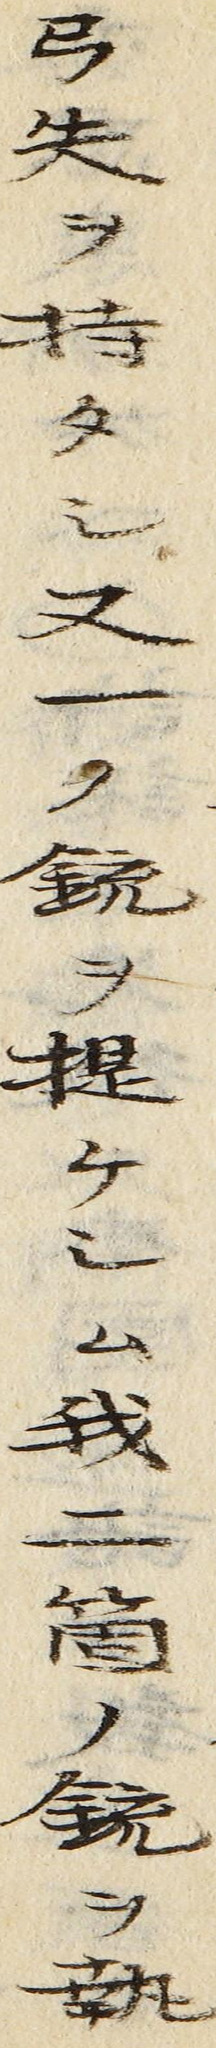弓矢ヲ持タシ又一ノ銃ヲ提ケシム我二箇ノ銃ヲ執
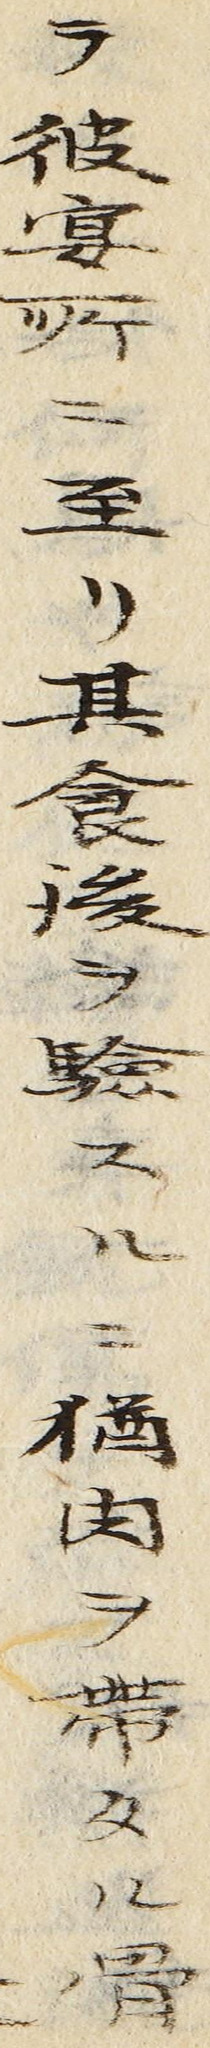テ彼宴所ニ至リ其食後ヲ験スルニ猶肉ヲ帯タル骨
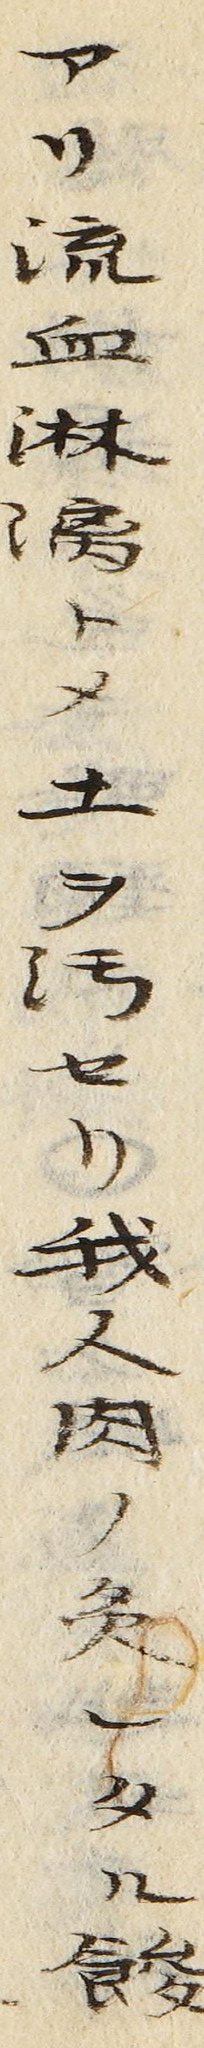アリ流血淋漓トシテ土ヲ汚セリ我人肉ノ炙レタル餕
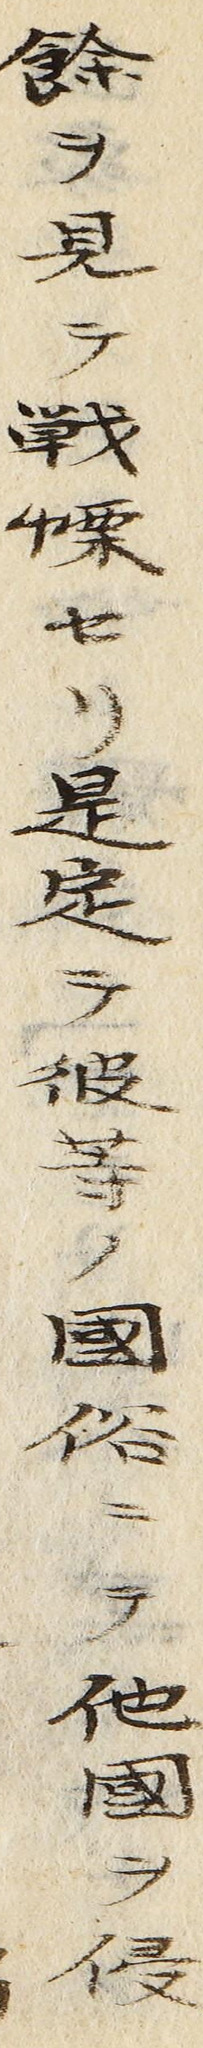余ヲ見テ戦慄セリ是定テ彼等ノ国俗ニテ他国ヲ侵
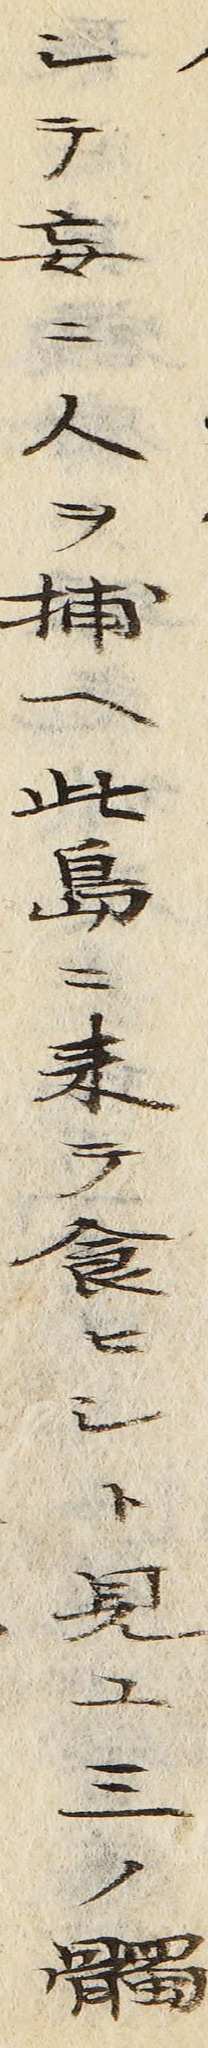シテ妄ニ人ヲ捕ヘ此島ニ来テ食ヒシト見ユ三ノ髑
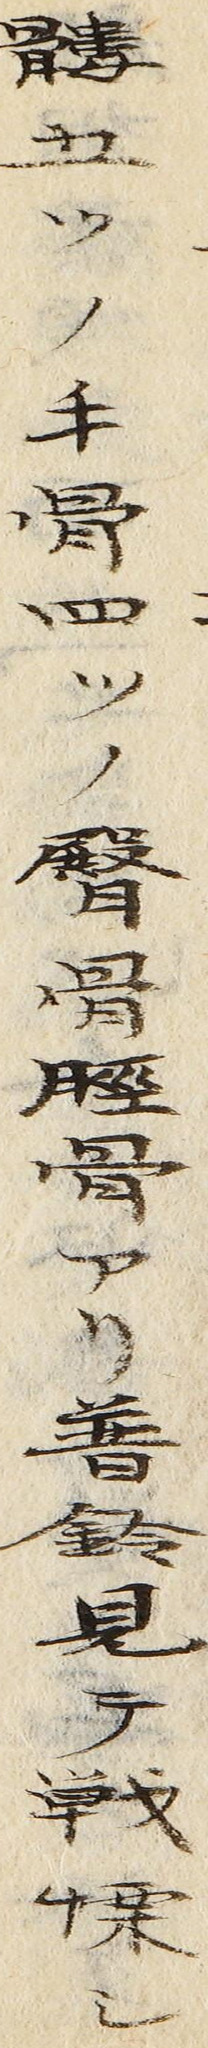髏五ツノ手骨四ツノ臀骨脛骨アリ普鈴見テ戦慄シ
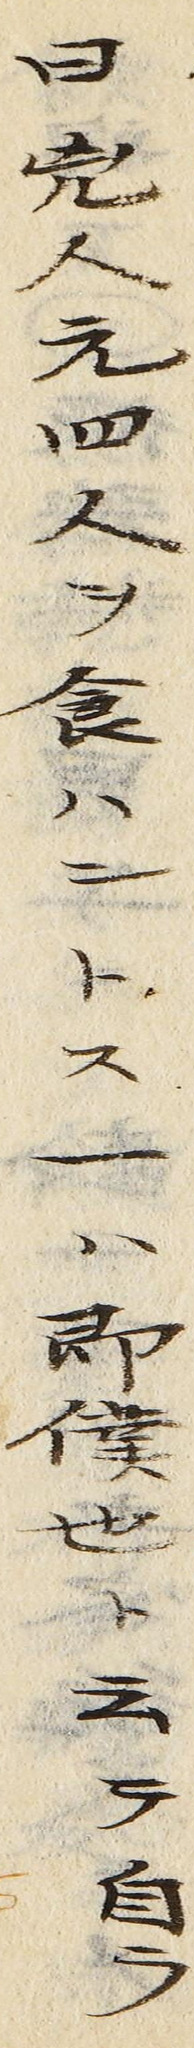曰兇人元四人ヲ食ハントス一ハ即僕也ト云テ自ラ
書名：漂流紀事
